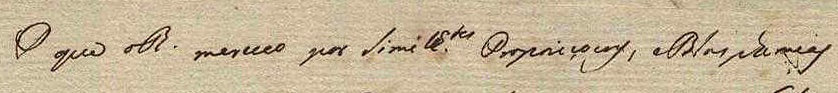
P que o R. mereceo por similh.tes Propoziçoens, e Blasphemeas
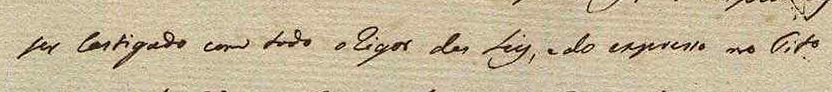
ser castigado com todo o Rigor das Leis, e do expresso no Tit.o
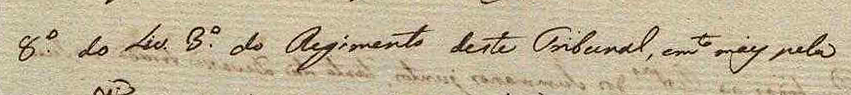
8.o do Liv. 3.o do Regimento deste Tribunal, e m.to mais pela
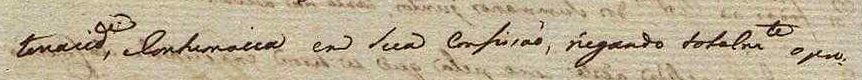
tenacid.e, e Contumacia em sua Confissaõ, negando totalm.te o pro
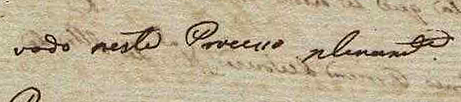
vado neste Processo plenam.te.
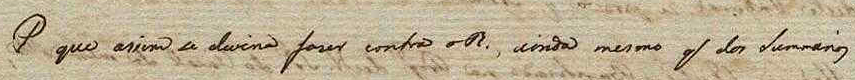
P que assim se deveria fazer contra o R., ainda mesmo q̄ dos Summarios
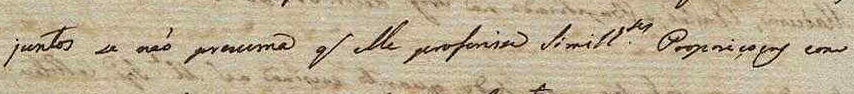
juntos se naõ presuma q̄ elle proferira Similh.tes Propoziçoens com
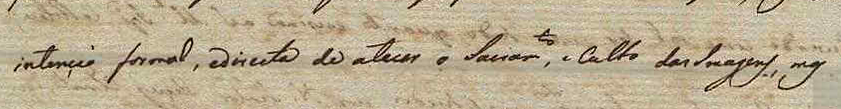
intençaõ formal, e directa de atacar o Sacram.to, e Culto das Imagens, mas
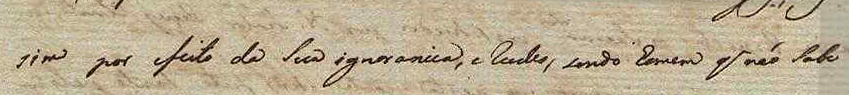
sim por efeito da sua ignorancia, e Rudes, sendo homem q̄ naõ sabe
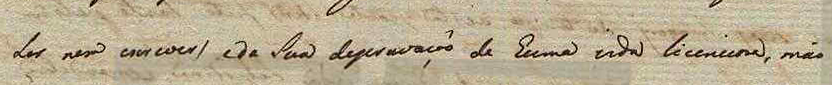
ler nem escrever/ e da Sua depravaçaõ de huma vida licencioza, máo
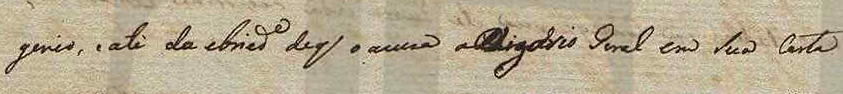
genio, e até da ebried.e de q̄ o acuza o Vigario Geral em Sua Carta
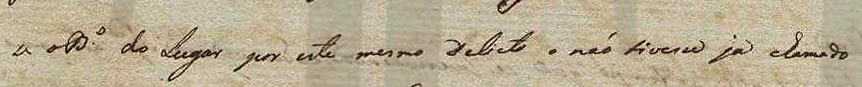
ao B.o do Lugar por este mesmo Delicto o naõ tivesse ja chamado
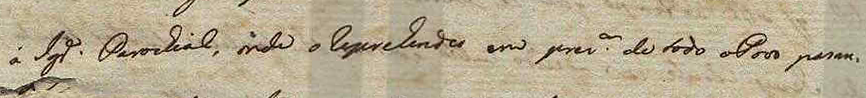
á Igr.a Parochial, onde o Reprehendeo em prez.a de todo o Povo pasan
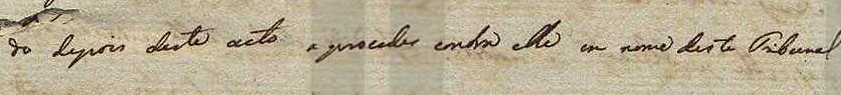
do depois deste acto a proceder contra elle em nome deste Tribunal
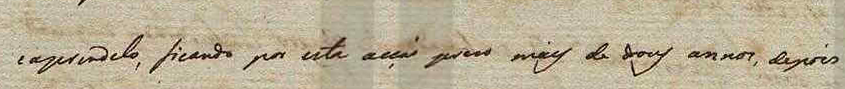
e a prendelo, ficando por esta acçaõ preso mais de dous annos, depois
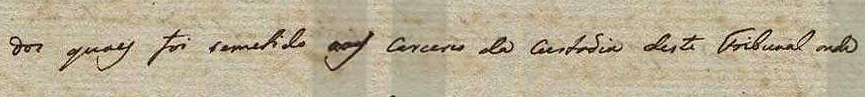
dos quaes foi remetido aos carceres da custodia deste Tribunal onde
